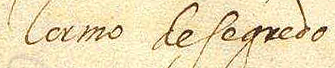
Termo de segredo
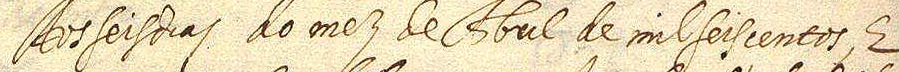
Aos seis dias do mez de Abril de mil seiscentos, E
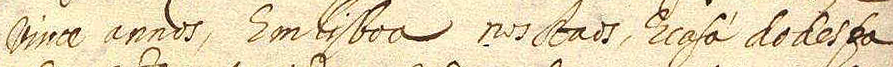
vinte annos, Em lisboa nos estaos, E casa do despa
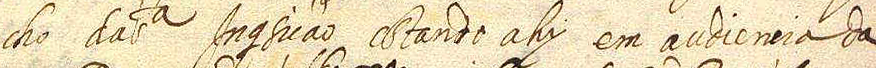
cho da sta Jnꝗsição estando ahy em audiencia da
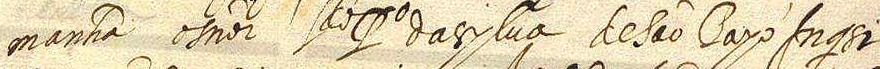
manhã o snōr Ldo Po da sylua de Saõ Payo Jnꝗsi
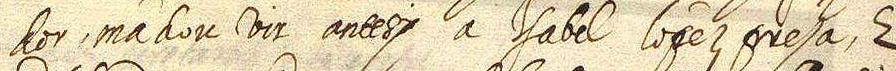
dor, mādou vir ante sy a Isabel lopēz preza, E
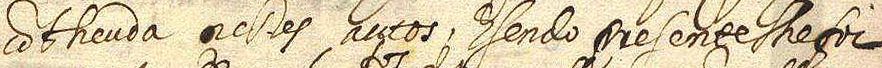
cōtheuda nestes autos, E sendo presente lhe foi
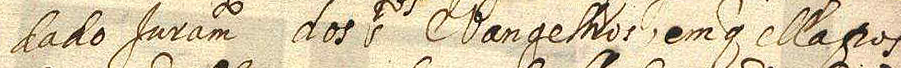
dado Juramto dos stos euangelhos, em q̄ ella pos
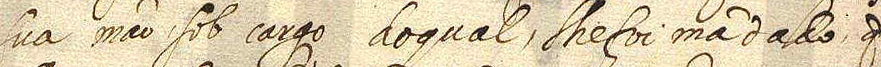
sua mão, sob cargo do qual, lhe foi mādado q̄
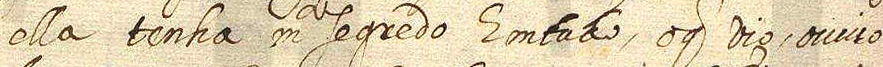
ella tenha mto segredo Em tudo, o q̄ vio, ouuio,
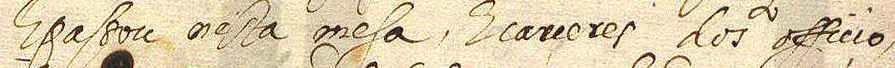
E passou nesta mesa, E carceres do sto officio,
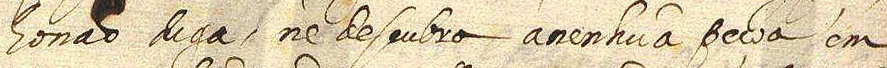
E o naõ diga, nē descubra a nenhuā peçoa em
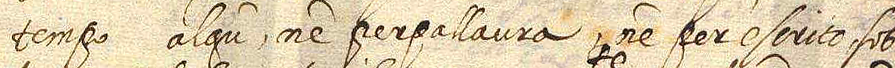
tempo algū, nē per pallaura, nē per escrito, sob
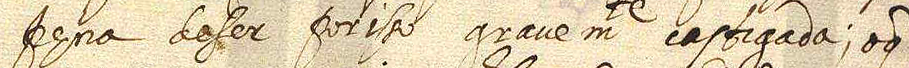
pena de ser por isso grauemte castigada; o q̄
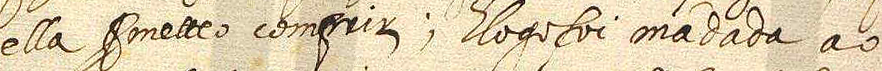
ella ꝓmetteo comprir; E logo foi mādada ao
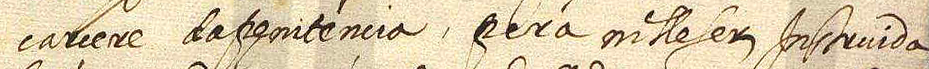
carcere da penitencia, pera nelle ser Jnstruida
